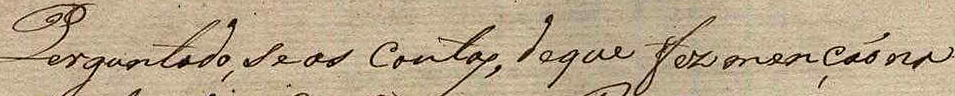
Perguntado, se as contas, de que fez mençaõ na
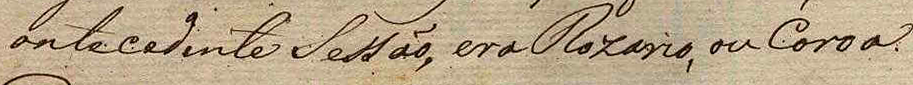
antecedente Sessaõ, era Rozario, ou Coroa.
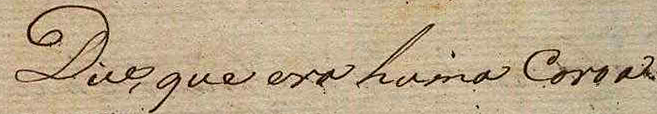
Dice, que era huma Coroa
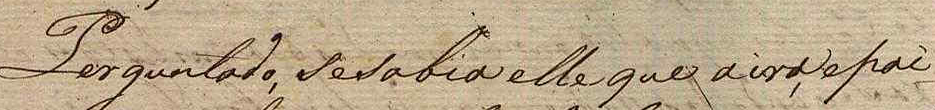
Perguntado, se sabia elle que a ira, e pai
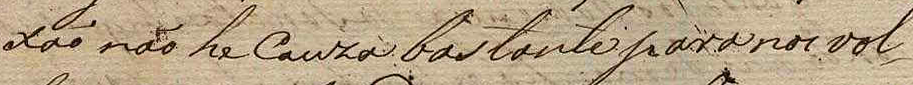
xaõ naõ he cauza bastante para nos vol
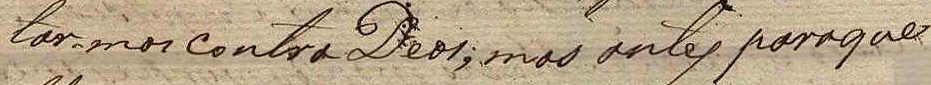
tar-mos contra Deos; mas antes para que
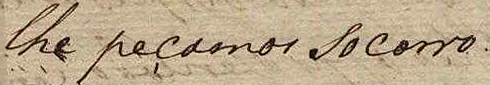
lhe peçamos socorro.
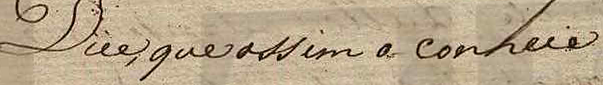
Dice, que assim o conhece
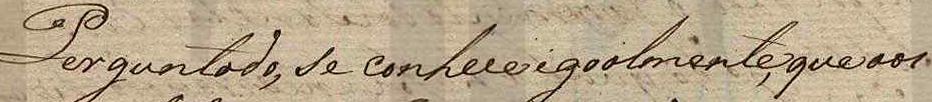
Perguntado, se conhece igualmente, que aos
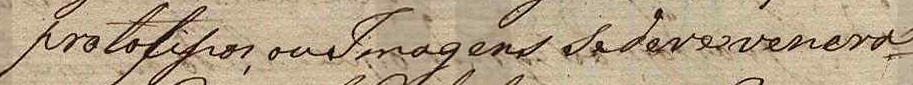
prototipos, ou Imagens se deve venera
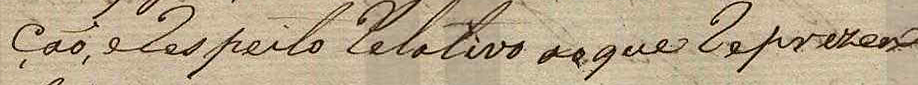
çaõ, e Respeito Relativo ao que Reprezen
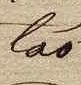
taõ.
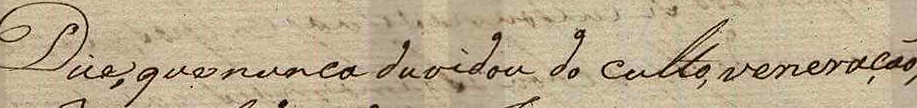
Dice, que nunca duvidou do culto, veneração,
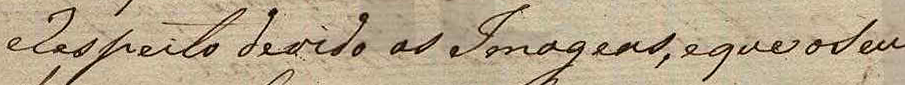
e Respeito devido as Imagens, e que o seu
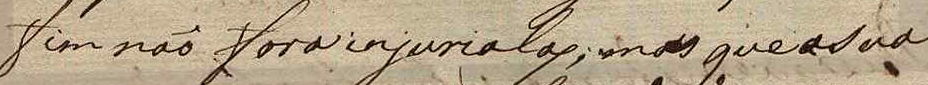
fim não fora injuria las, mas que a sua
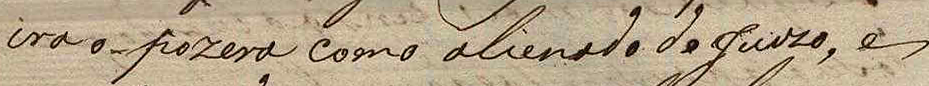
ira o pozera como alienado do Juizo, e
